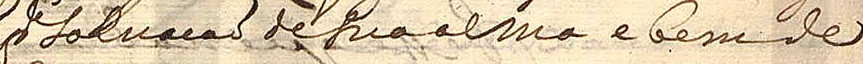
pa saluacaõ de sua alma e bem de
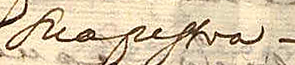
sua pessoa
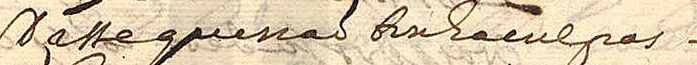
Disse que naõ tinha culpas
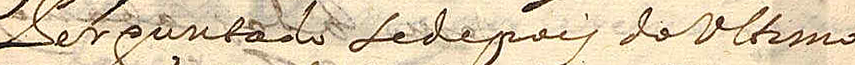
Perguntado se depois do Vltimo
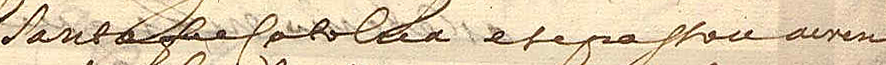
Santa fee Catolica e se passou a cren
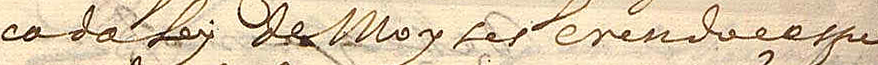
ca da Ley de Moyses crendo e espe
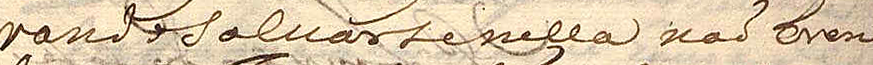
rando saluarse nella naõ cren
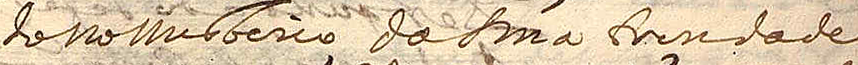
do no misterio da smā trindade
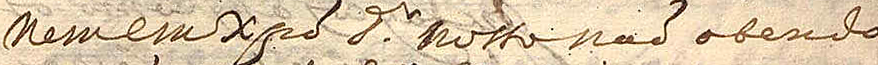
nem em xpō sor. nosso naõ o tendo
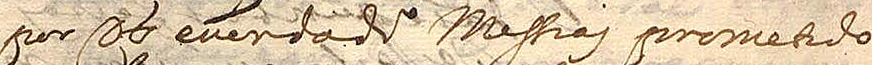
por Ds̄ e uerdadro Messias prometido
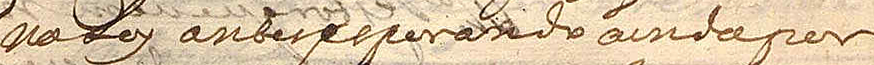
na Ley antes esperando ainda per
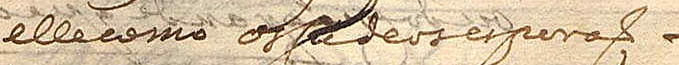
ele como os Judeos esperaõ
